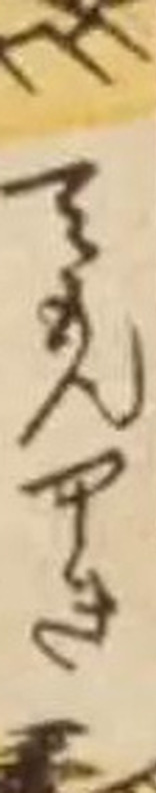てもんやき
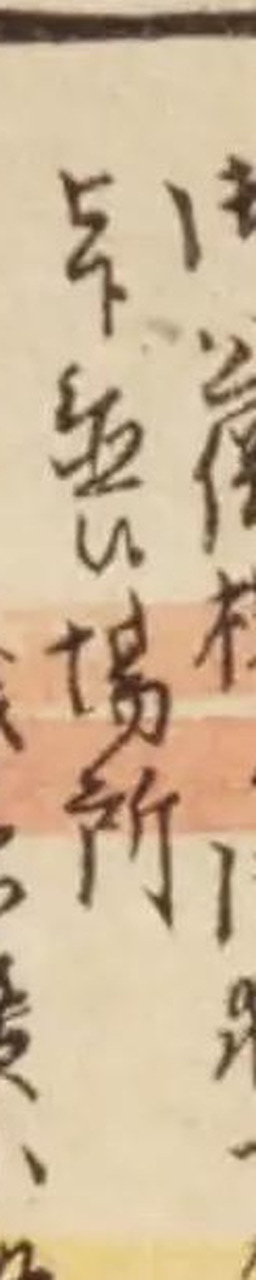被下置候場所
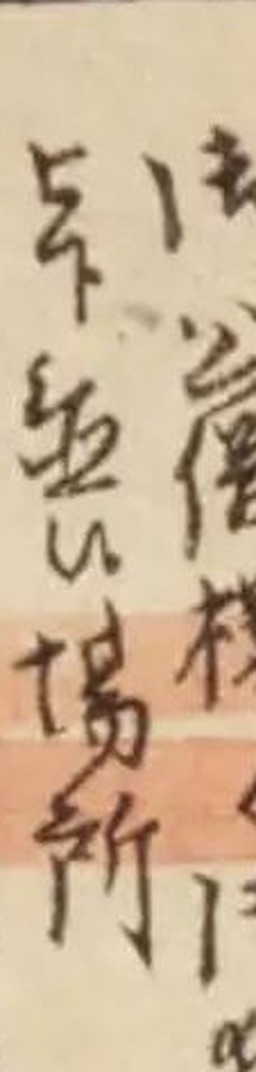被下置候場所
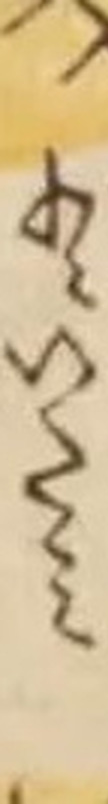いたみ
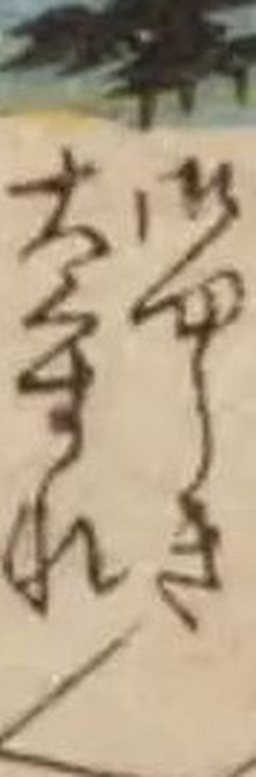大くすれ
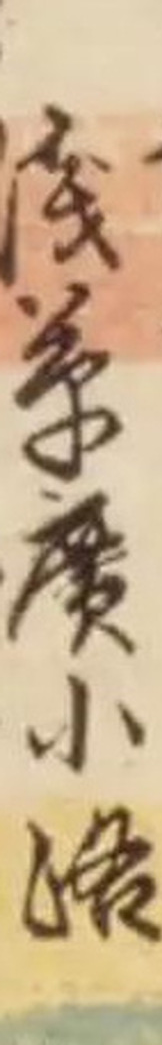浅草廣小路
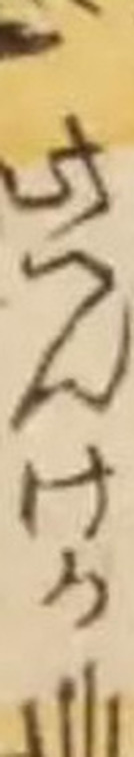此へんけか
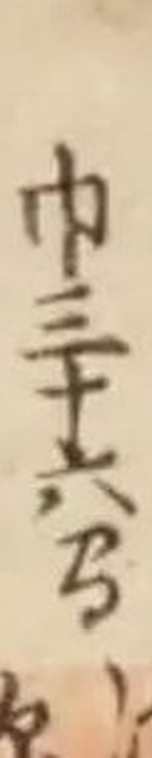巾三十六間
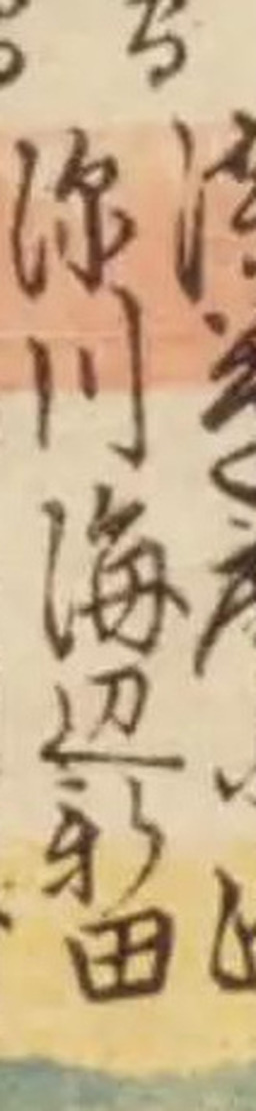深川海辺新田
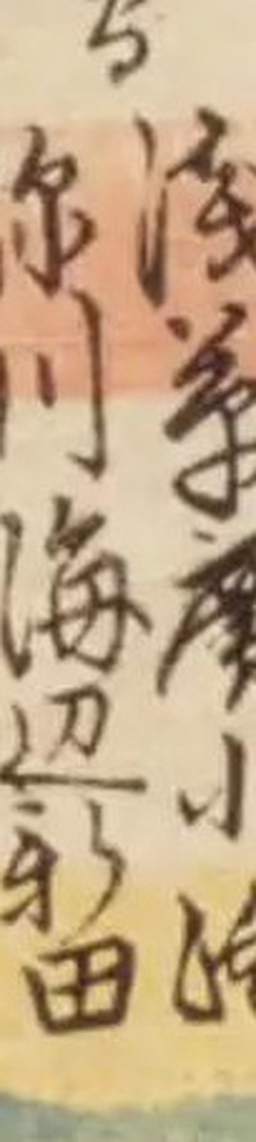深川海辺新田
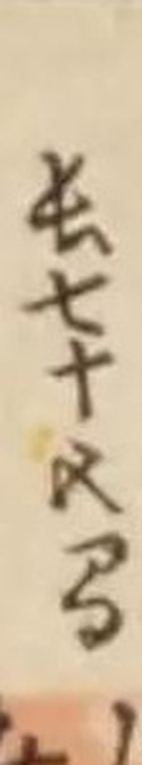長七十五間
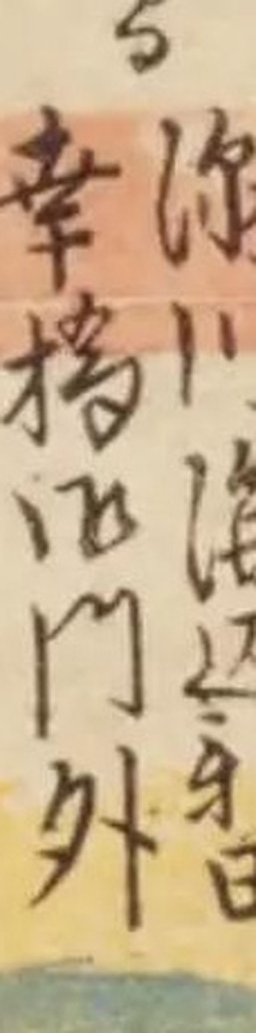幸橋御門外
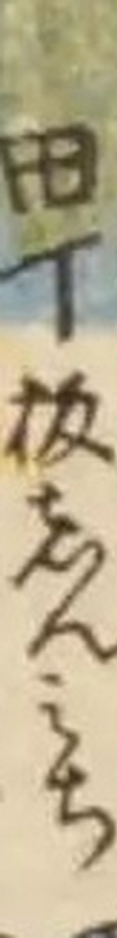田丁板しんみち
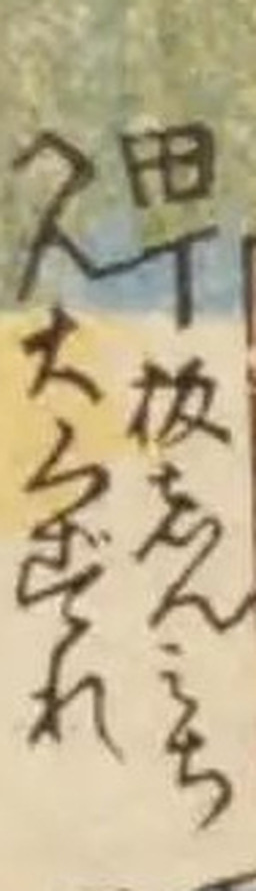へん大くずれ
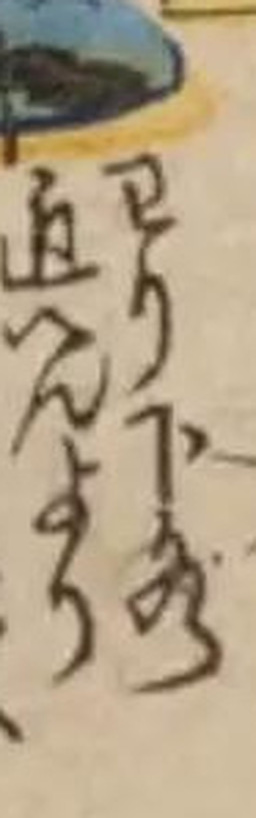近へんより
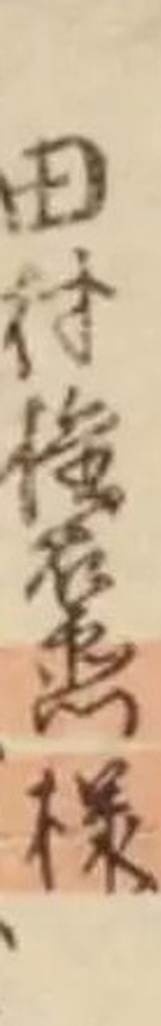田村権右衛門様
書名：銘細改板江戸大地震出火場所附
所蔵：国立国会図書館 National Diet Library, JAPAN
